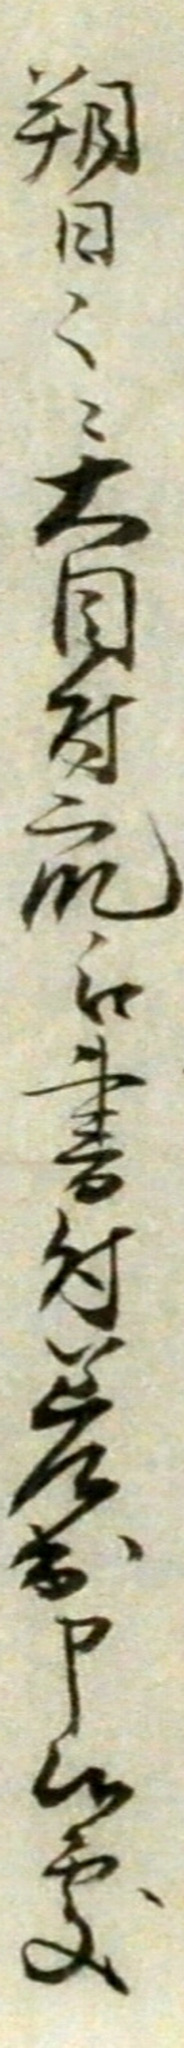朔日々々大目付衆え書付差出申候処
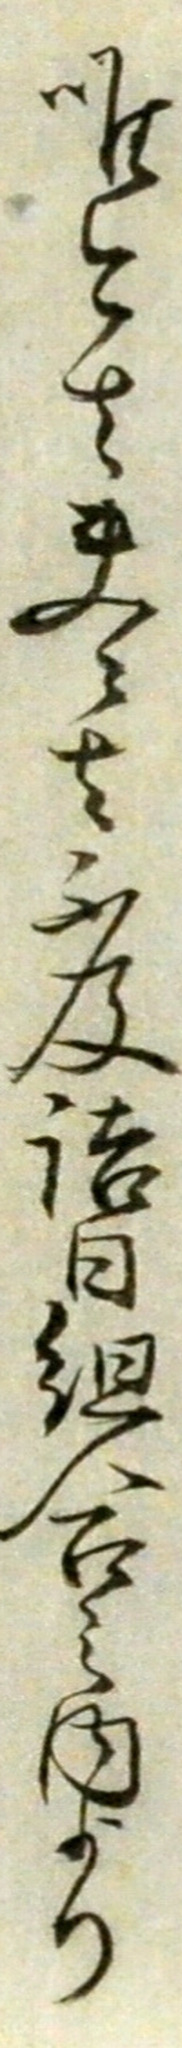唯今は夫には不及詰日組合之内より
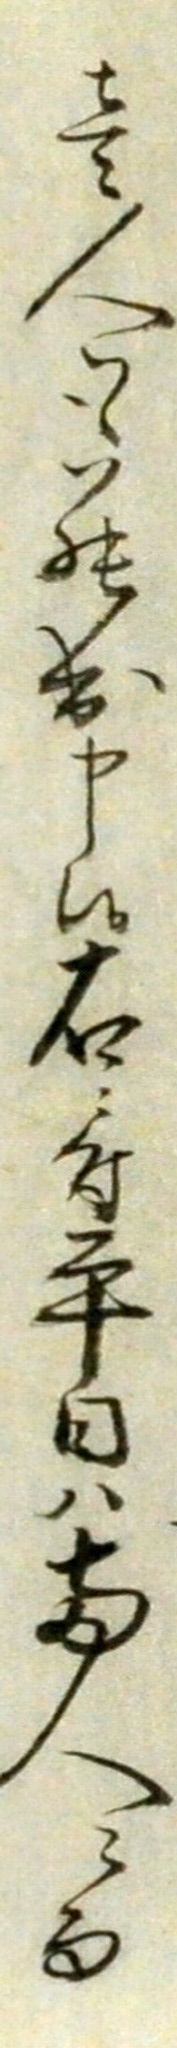壱人ツヽ罷出申候右に付平日は両人にて
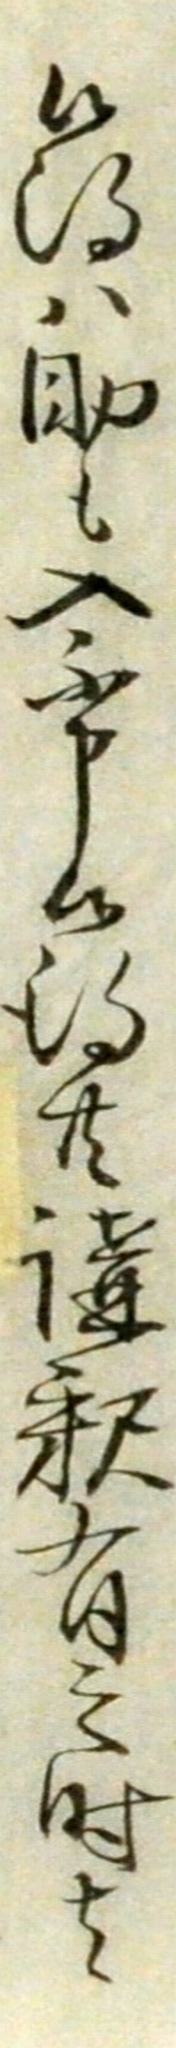候得は助も入不申候得共講釈有之時は
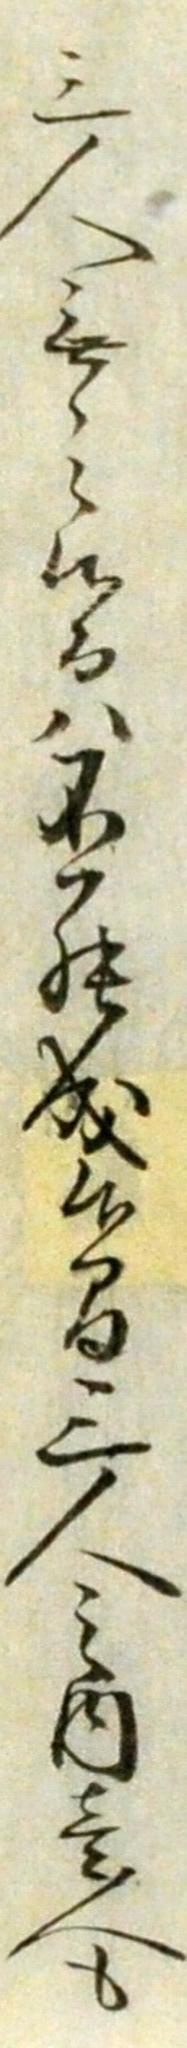三人無之候ては不罷成候間三人之内壱人も
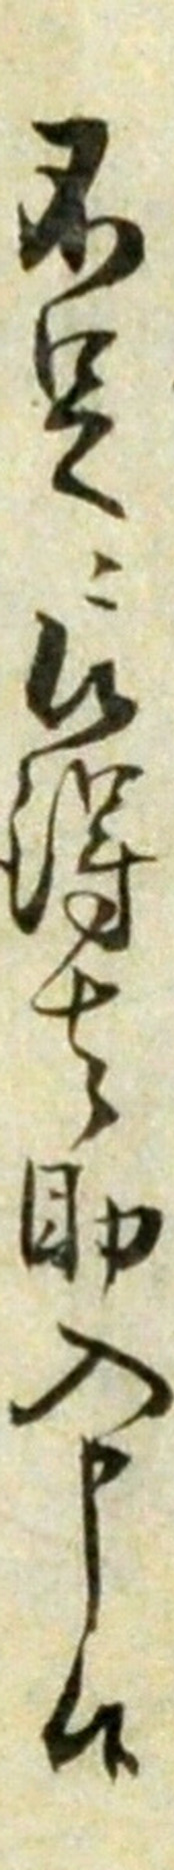不足に候得は助入申候
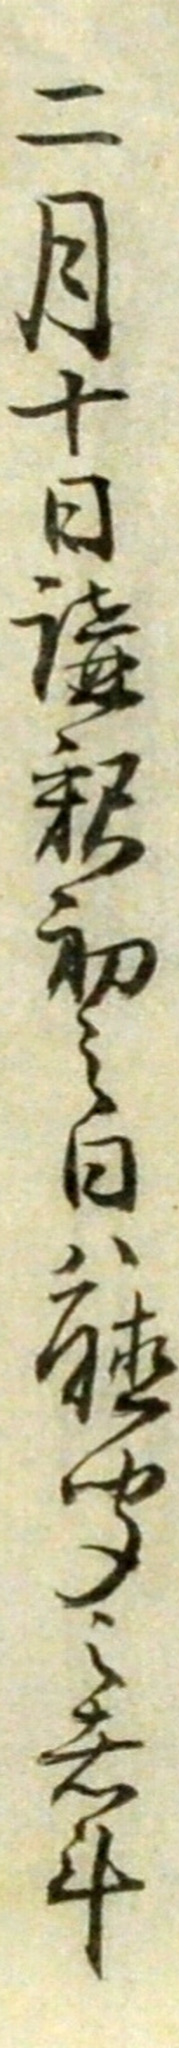二月十日講釈初之日は聴聞之者斗
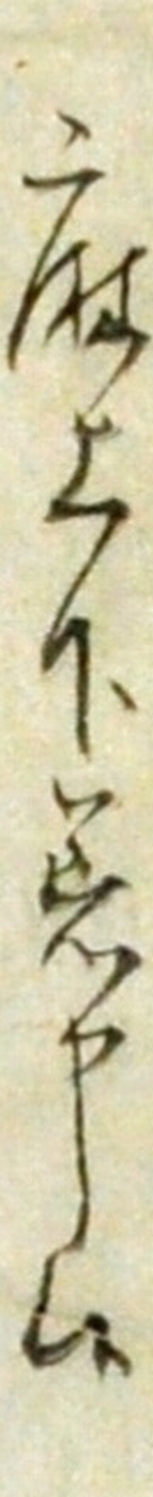麻上下着申候
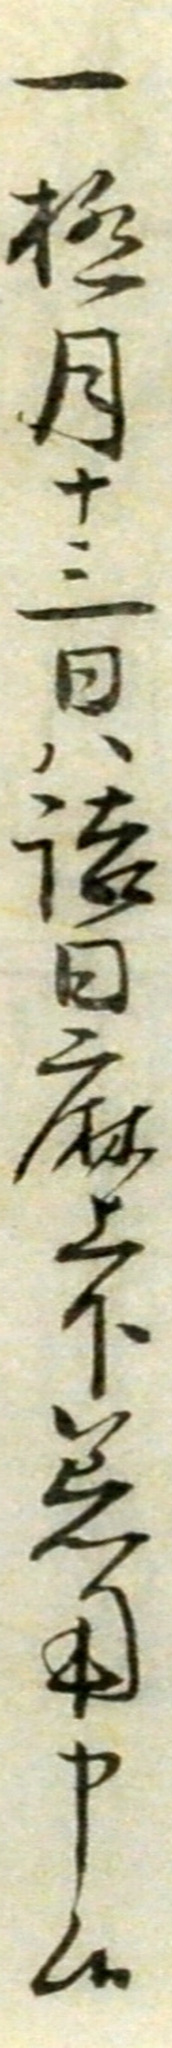一極月十三日は詰日麻上下着用申候
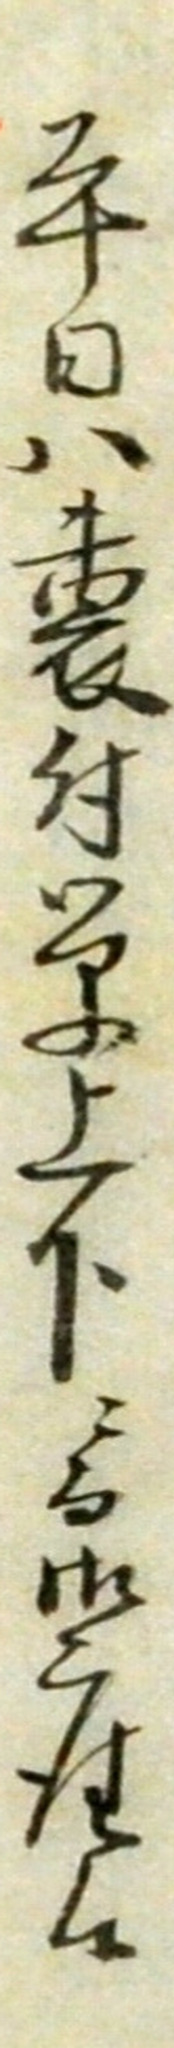平日は裏付単上下にて御座候
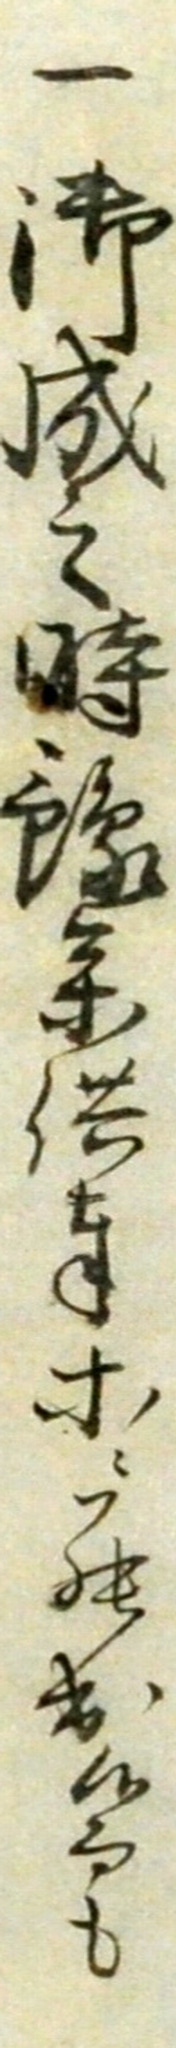一御成之時予参供奉等に罷出候ても
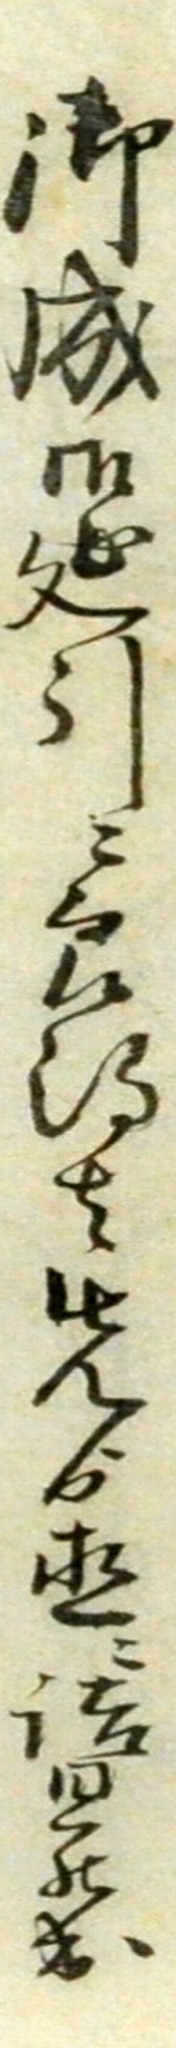御成御延引にて候得は先ゟ直に詰日罷出
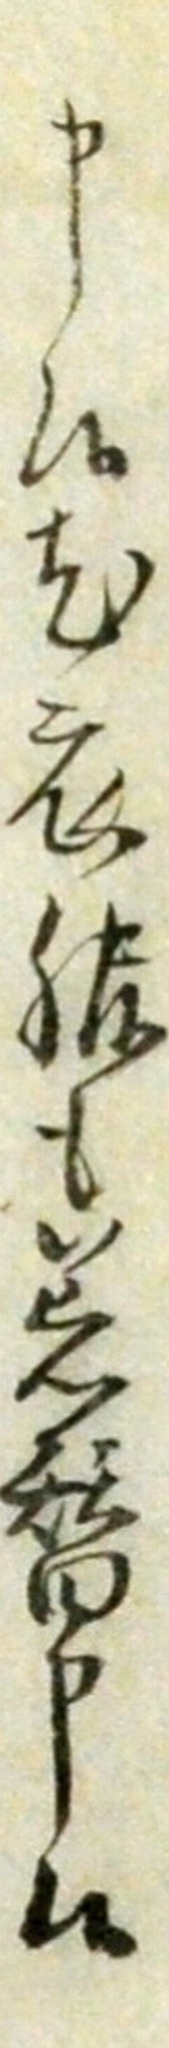申候尤衣服も着替申候

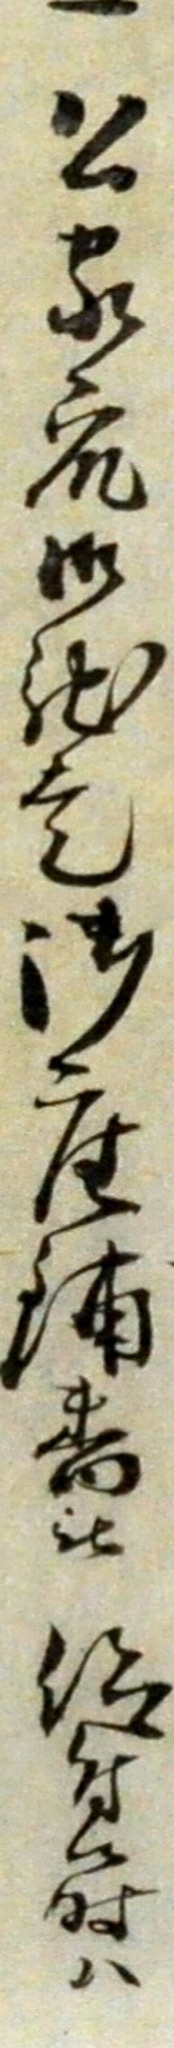一公家衆御馳走御座鋪番被仰付候時は
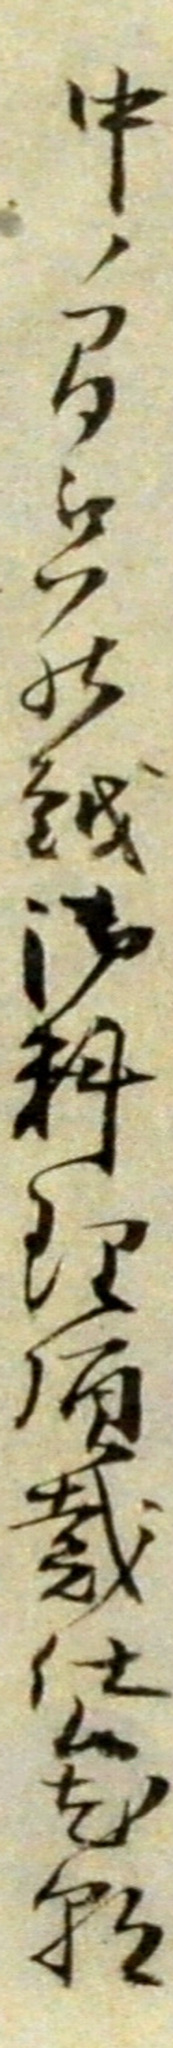中ノ間え罷越御料理頂戴仕候尤朝
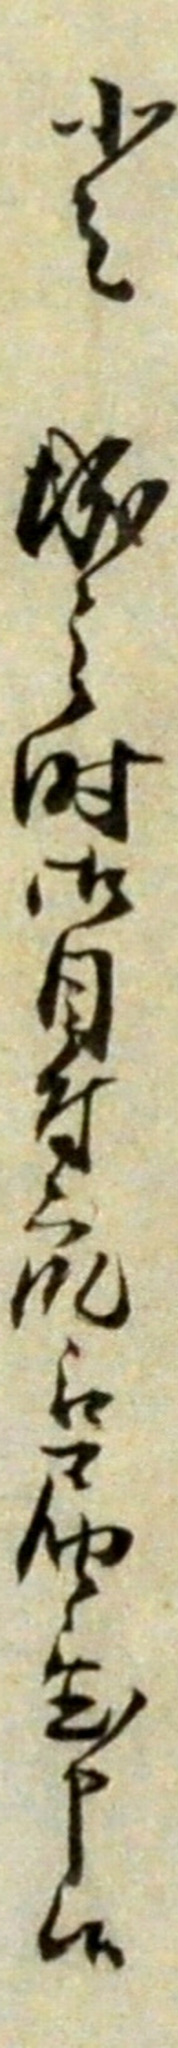登城之時御目付衆え届置申候
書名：申合帳〔一括〕
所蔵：伊那市立高遠町図書館・合同会社AMANE
